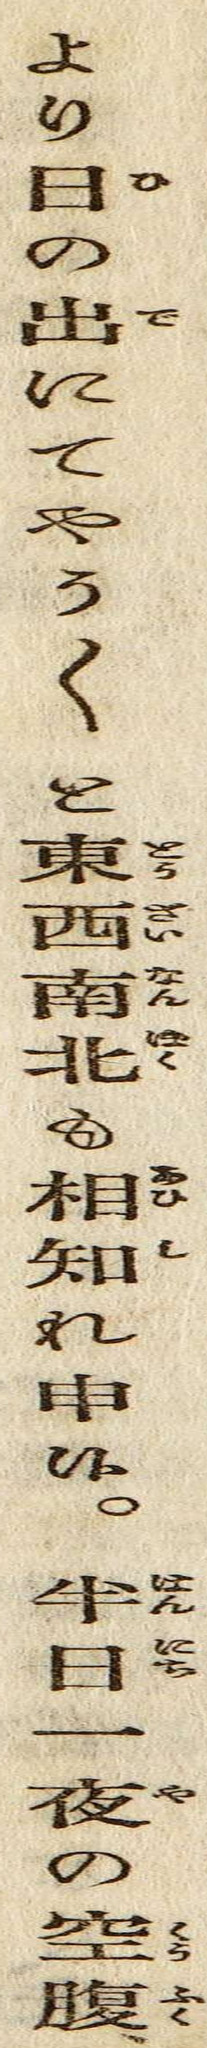より日の出にてやう〳〵と東西南北も相知れ申候。半日一夜の空腹、
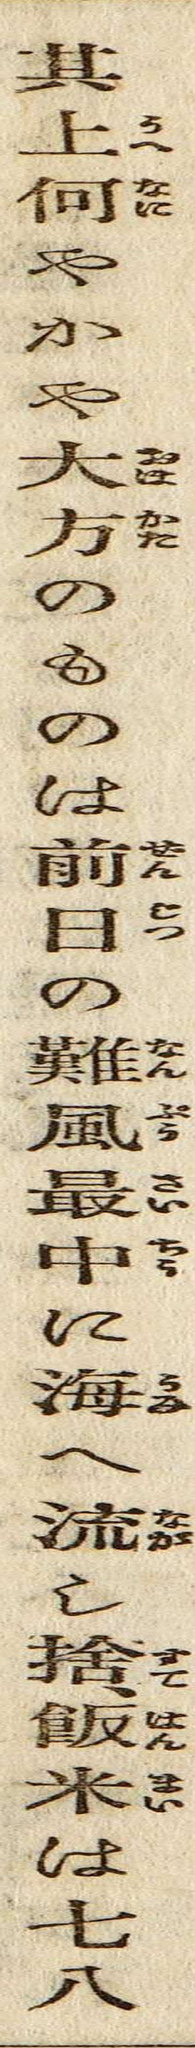其上何やかや大方のものは前日の難風最中に海へ流し捨、飯米は七八
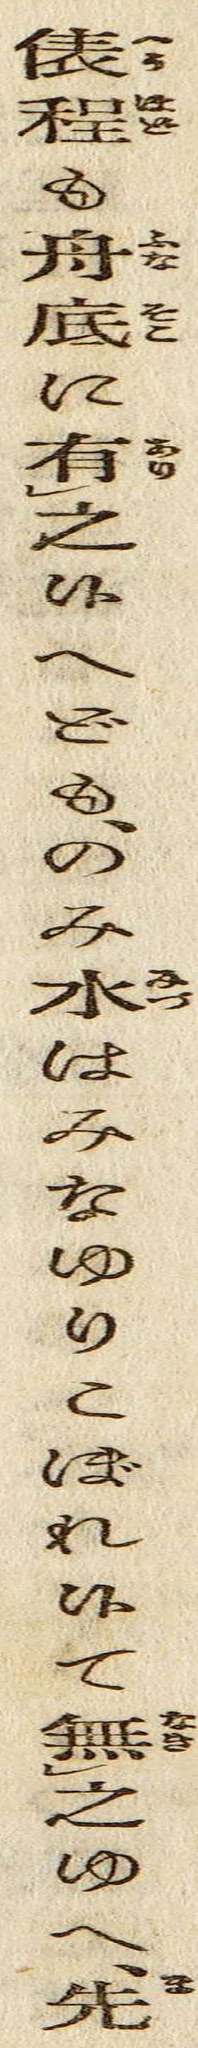俵程も舟底に有之候へども、のみ水はみなゆりこぼれ候て無之ゆへ、先
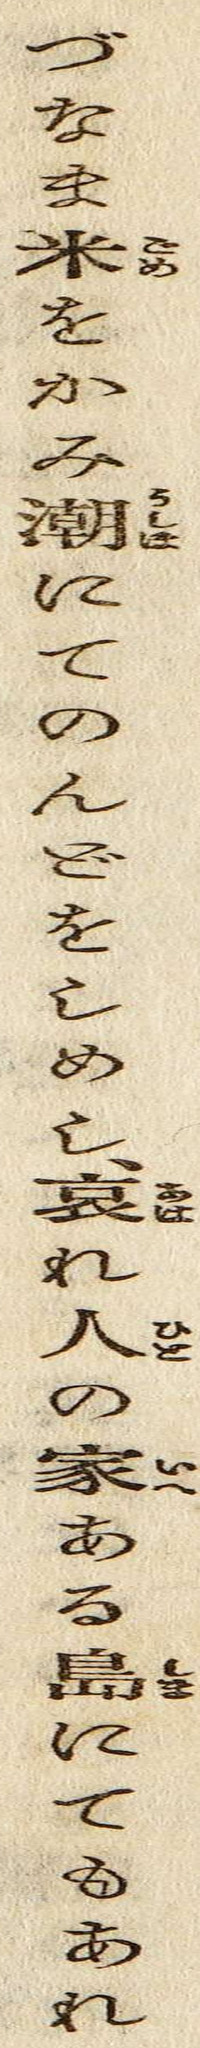づなま米をかみ潮にてのんどをしめし、哀れ人の家ある島にてもあれ
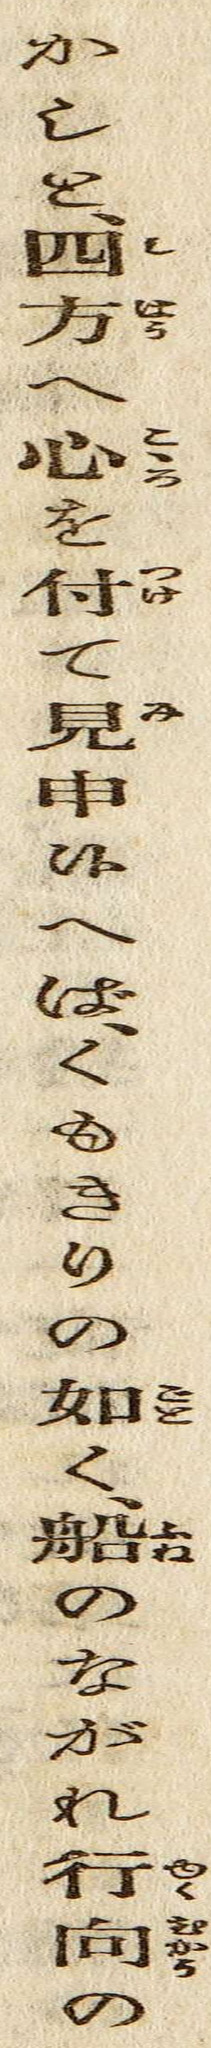かしと、四方へ心を付て見申候へば、くもきりの如く、船のながれ行向の
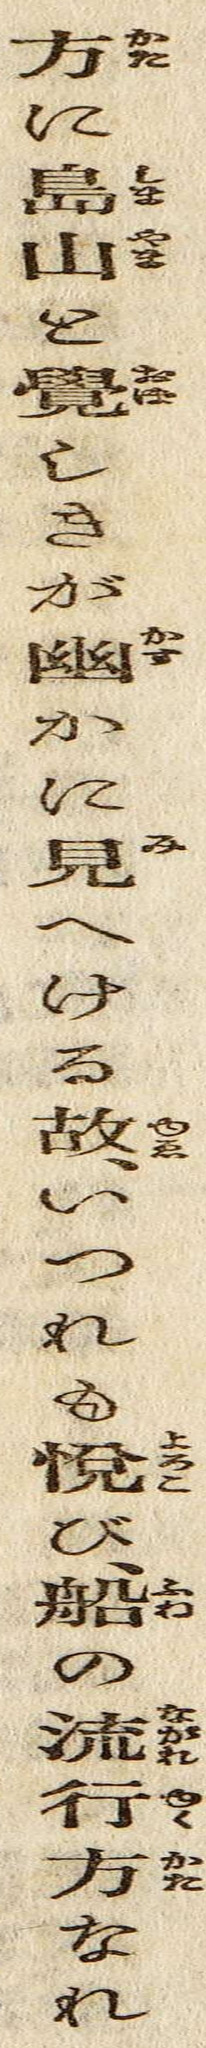方に島山と覚しきが幽かに見へける故、いつれも悦び、船の流行方なれ
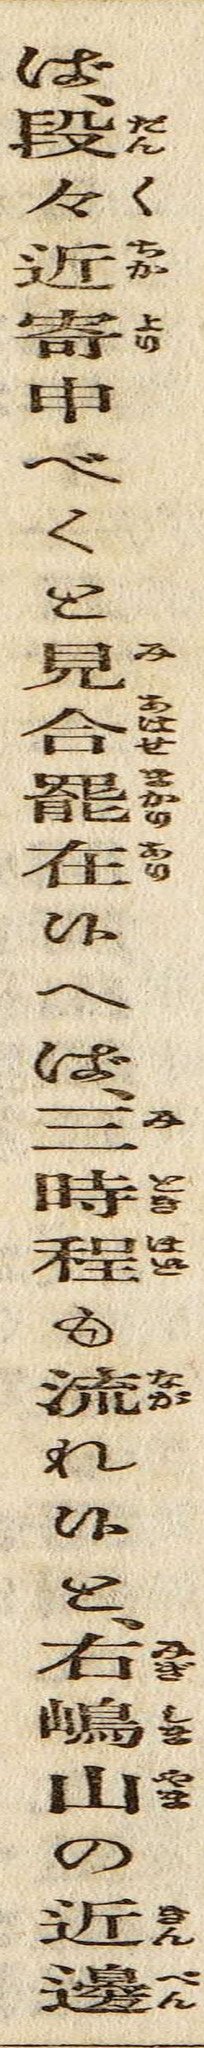ば、段々近寄申べくと見合罷在候へば、三時程も流れ候と、右嶋山の近辺
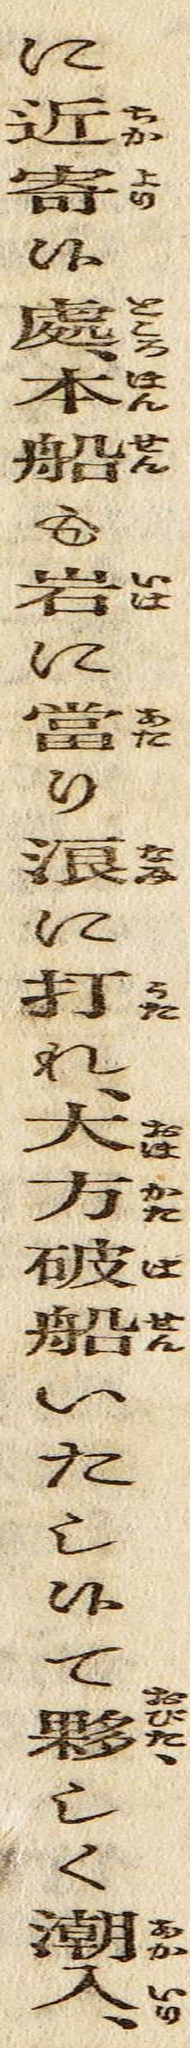に近寄候処、本船も岩に当り浪に打れ、大方破船いたし候て夥しく潮入、
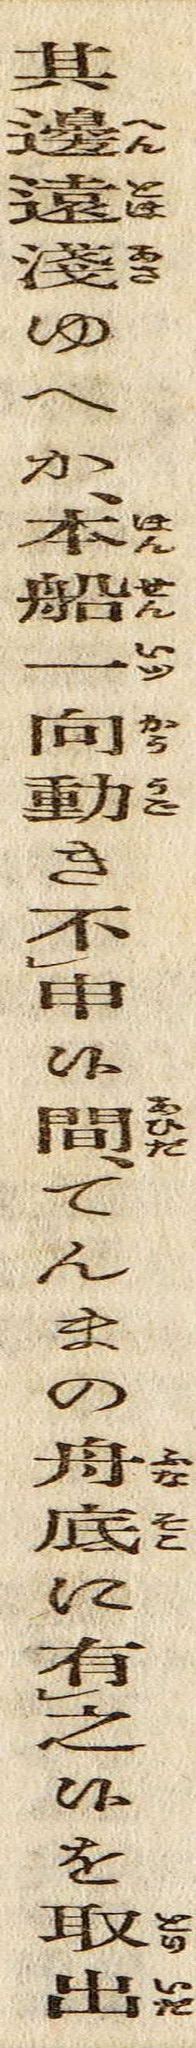其辺遠浅ゆへか、本船一向動き不申候間、てんまの舟底に有之候を取出
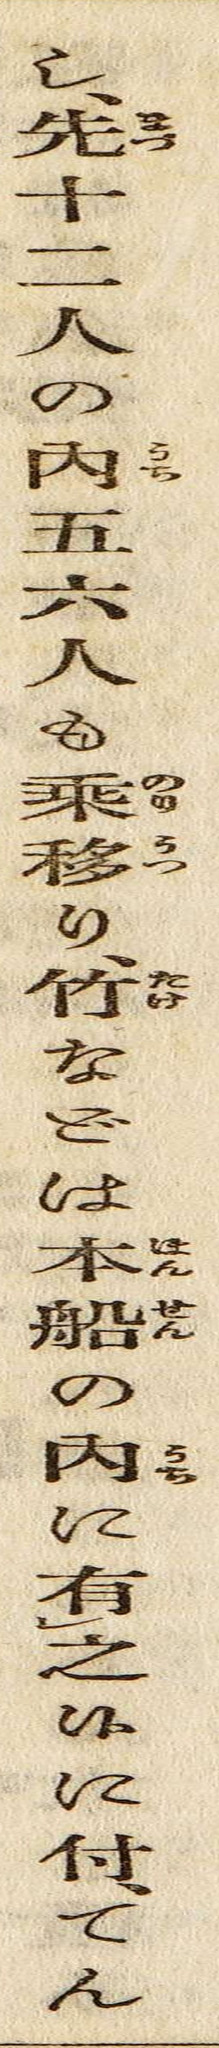し、先十二人の内五六人も乗移り、竹などは本船の内に有之候に付、てん
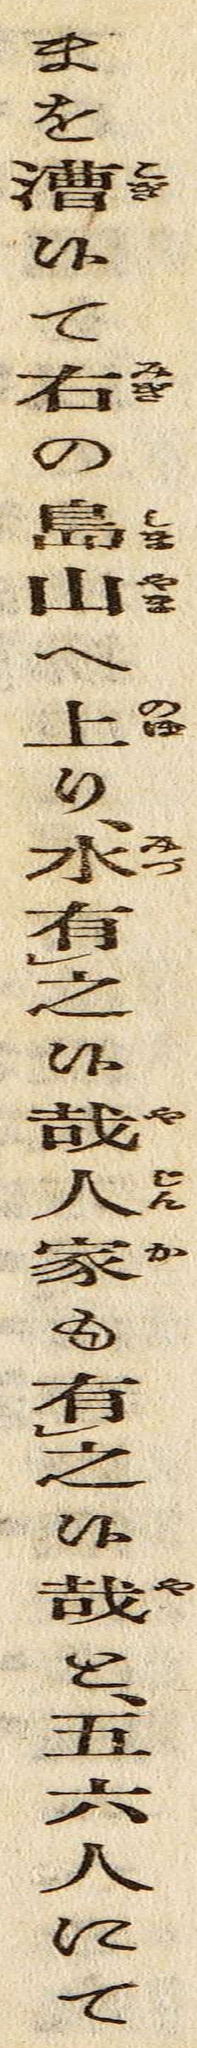まを漕候て右の島山へ上り、水有之候哉人家も有之候哉と、五六人にて
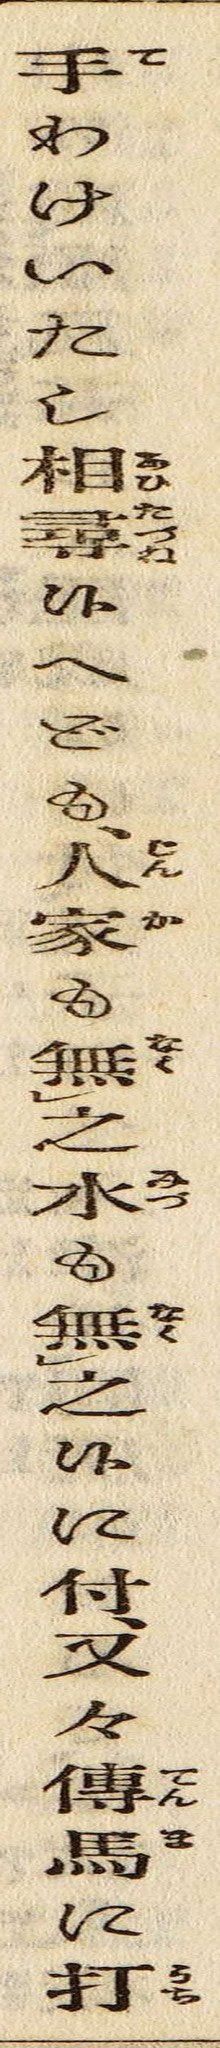手わけいたし相尋候へども、人家も無之水も無之候に付、又々伝馬に打

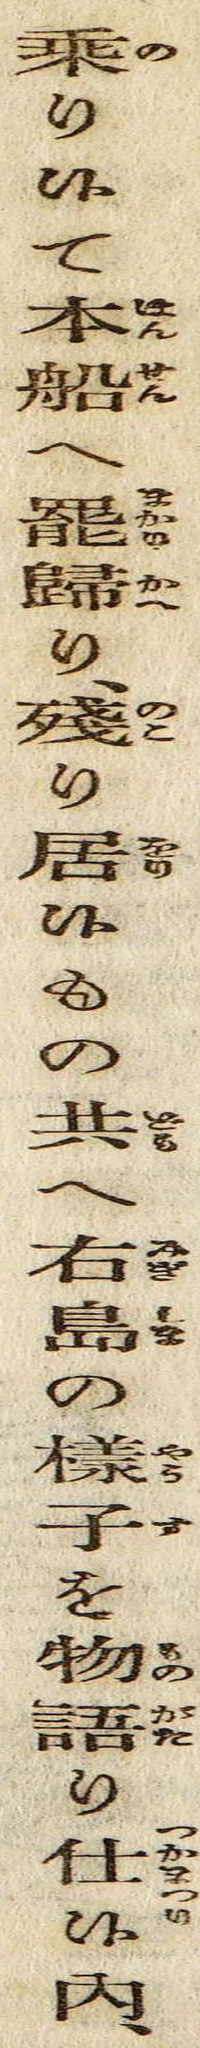乗り候て本船へ罷帰り、残り居候もの共へ右島の様子を物語り仕候内、
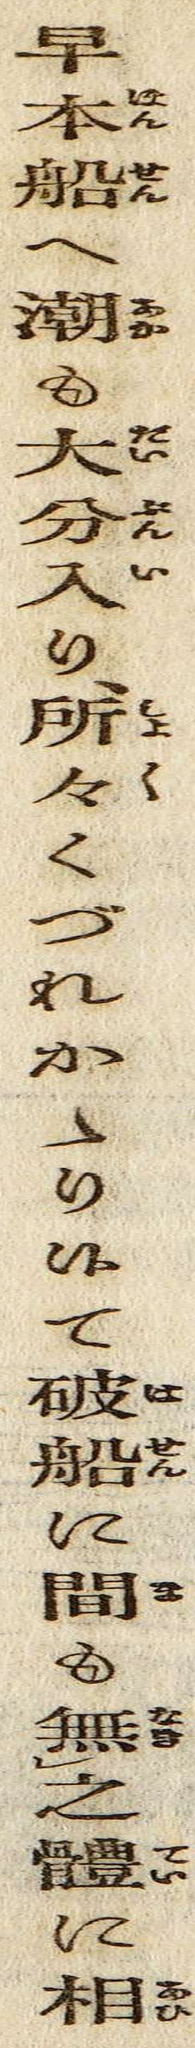早本船へ潮も大分入り、所々くづれかゝり候て破船に間も無之体に相
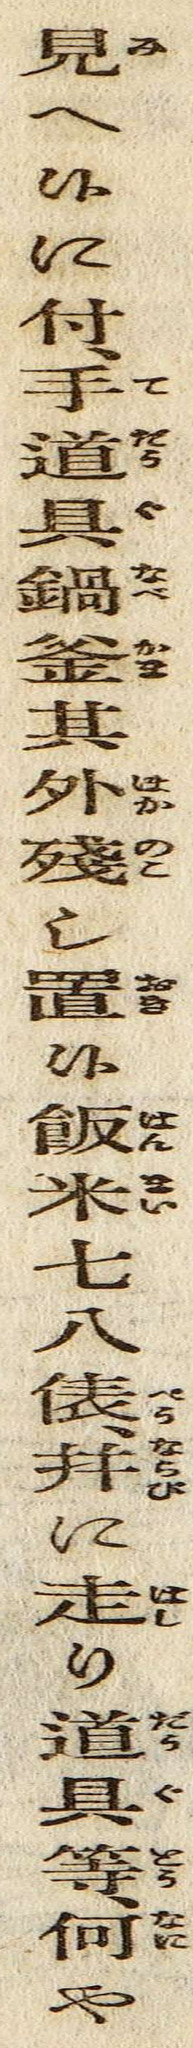見へ候に付、手道具鍋釜其外残し置候飯米七八俵、并に走り道具等、何や
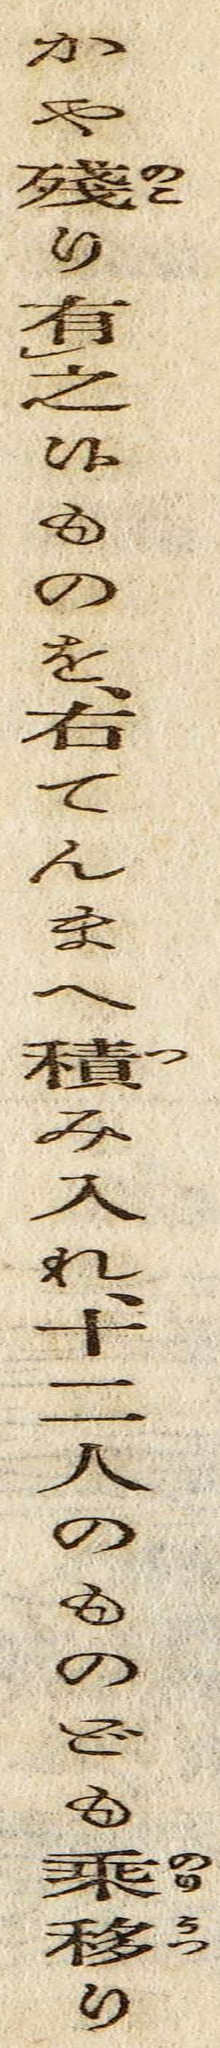かや残り有之候ものを、右てんまへ積み入れ、十二人のものども乗移り
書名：日本漂流譚
